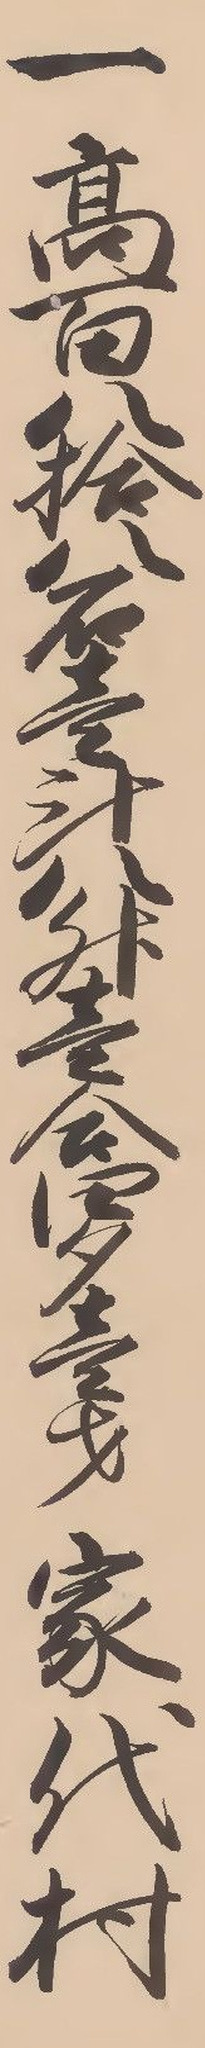一高百八拾八石壱斗八升壱合四尺壱才家代村
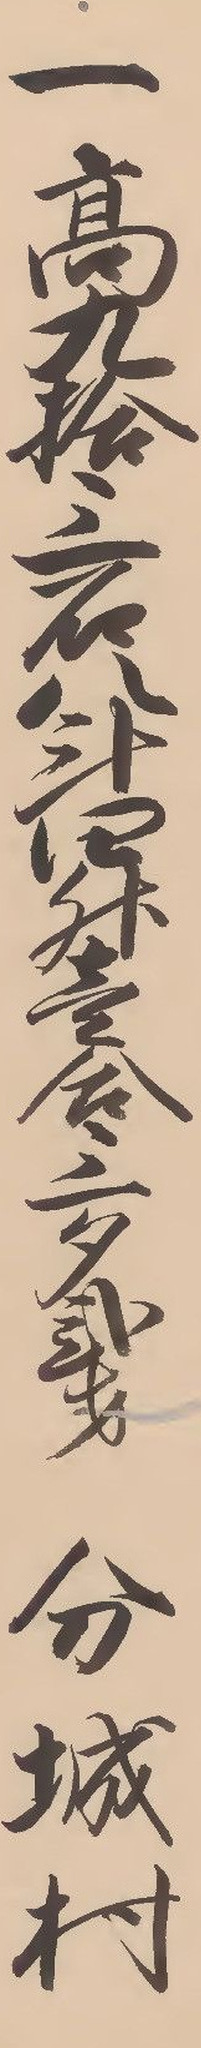一高九拾三石八斗四升壱合三勺弐才分城村

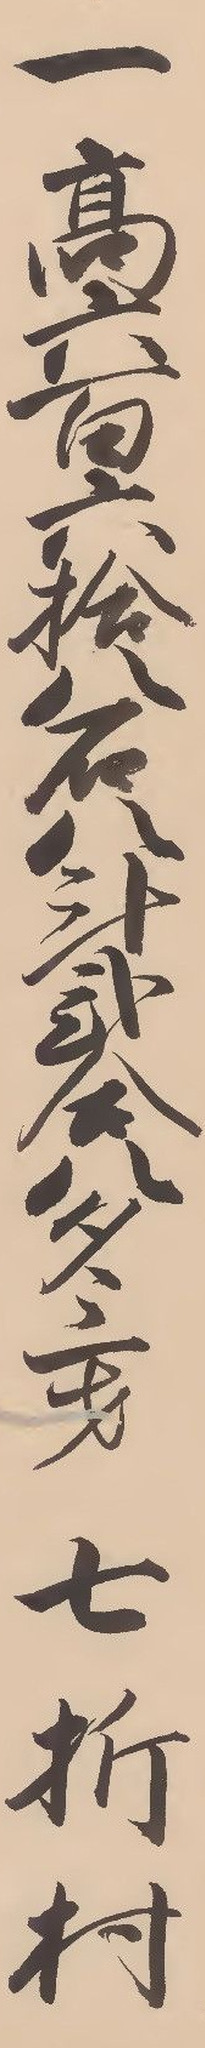一高六百六拾八石八斗弐合八勺三才七折村
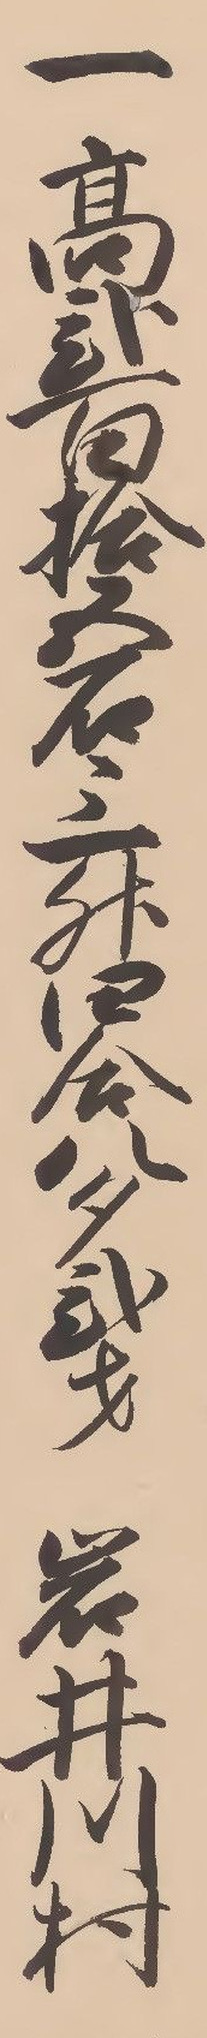一高弐百拾五石三升四合八勺弐才岩井川村
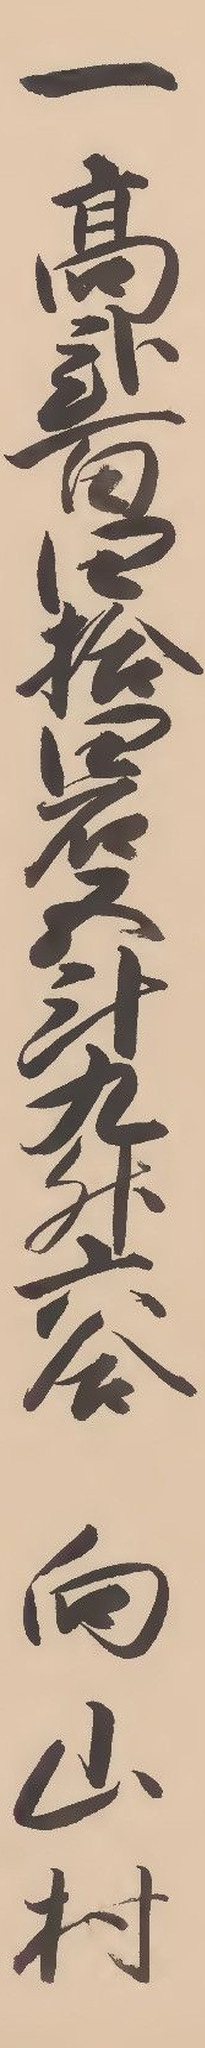一高弐百四拾四石五斗九升六合向山村
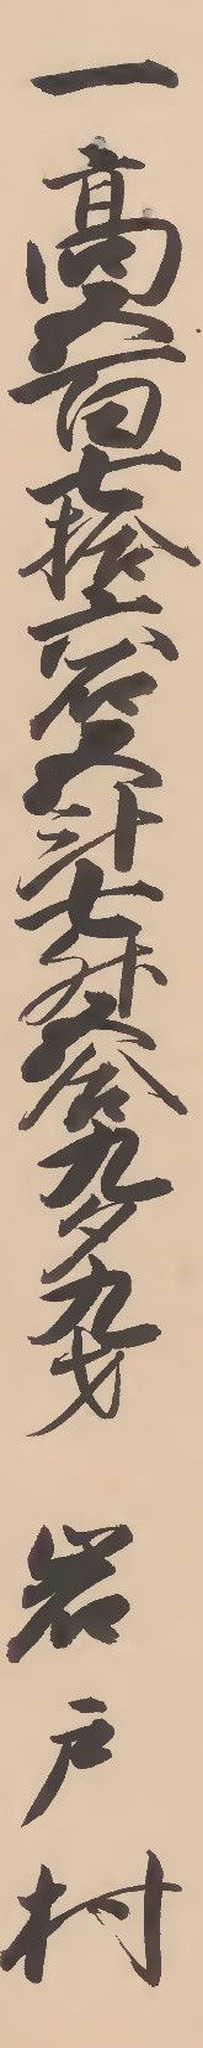一高五百七拾六石五斗七升五合九勺九才岩戸村
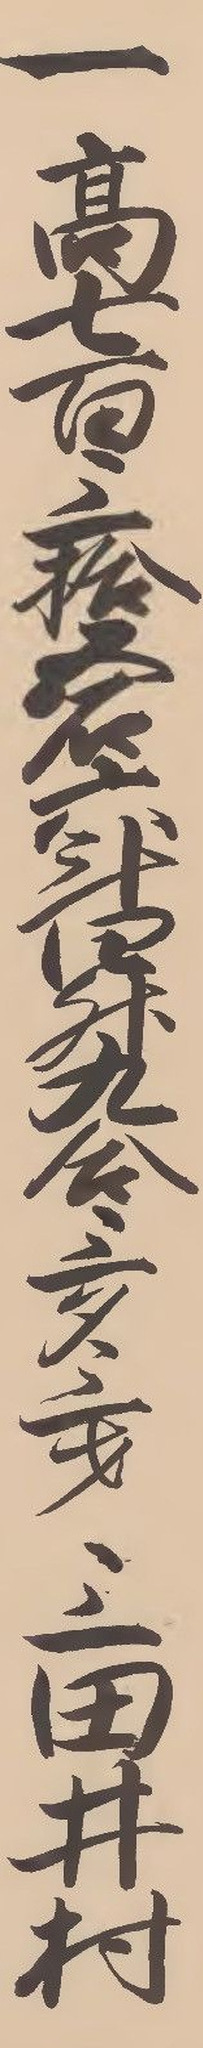一高七百三拾五石六斗四升九合三勺三才三田井村
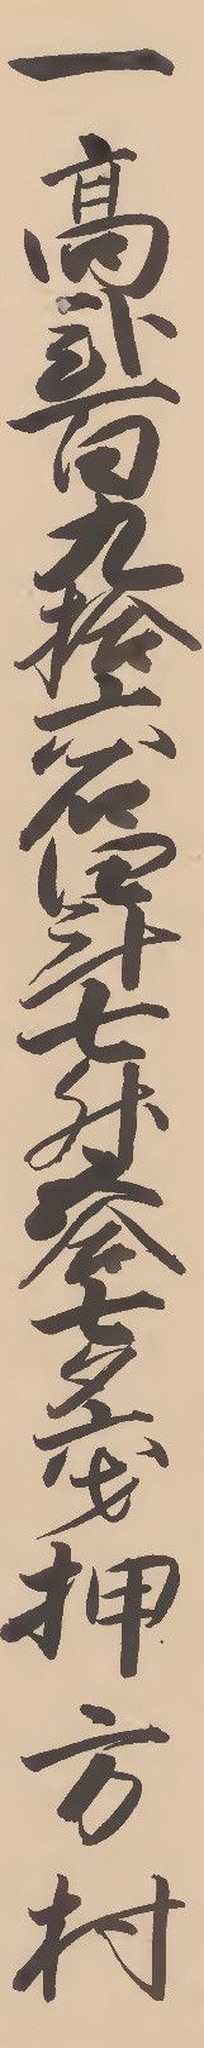一高弐百九拾六石四斗七升五合七勺六才押方村
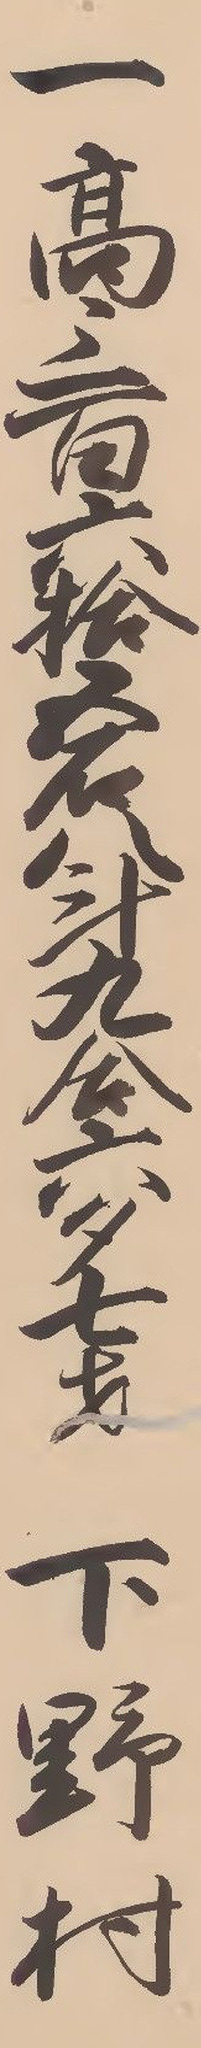一高三百六拾五石八斗九合六勺七才下野村

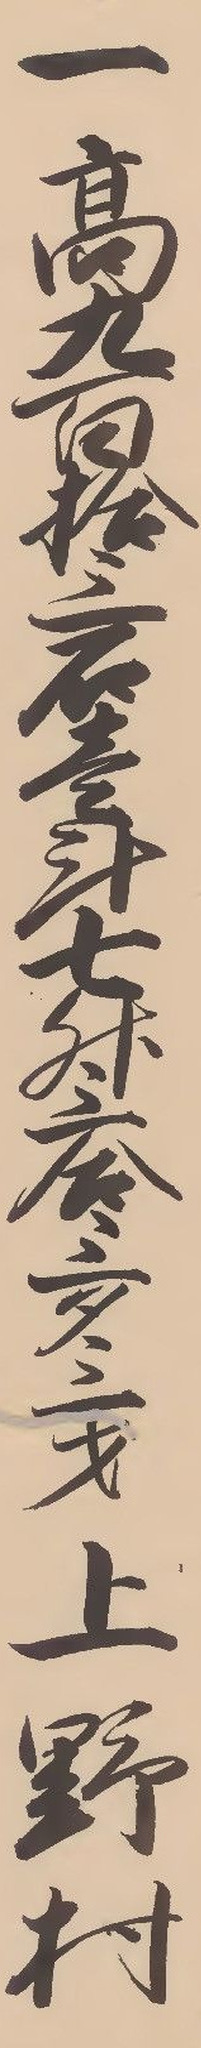一高九百拾三石壱斗七升三合三勺三才上野村
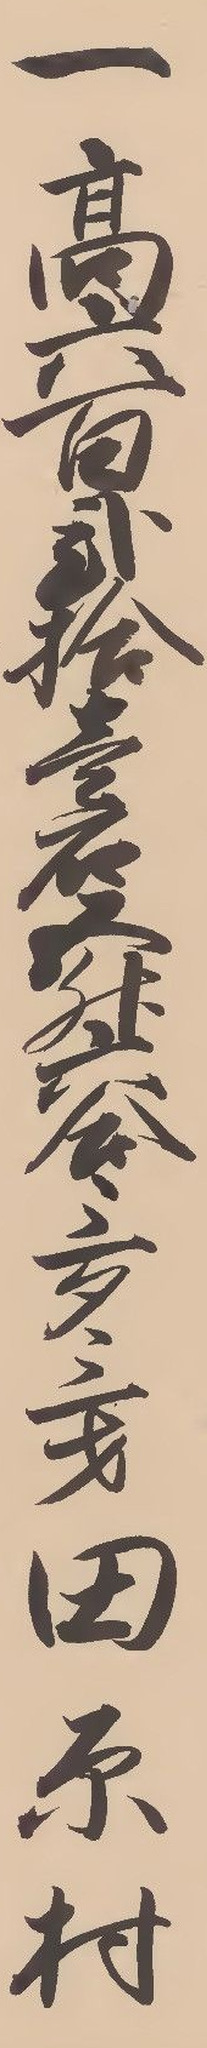一高六百弐拾壱石五升六合三勺三才田原村
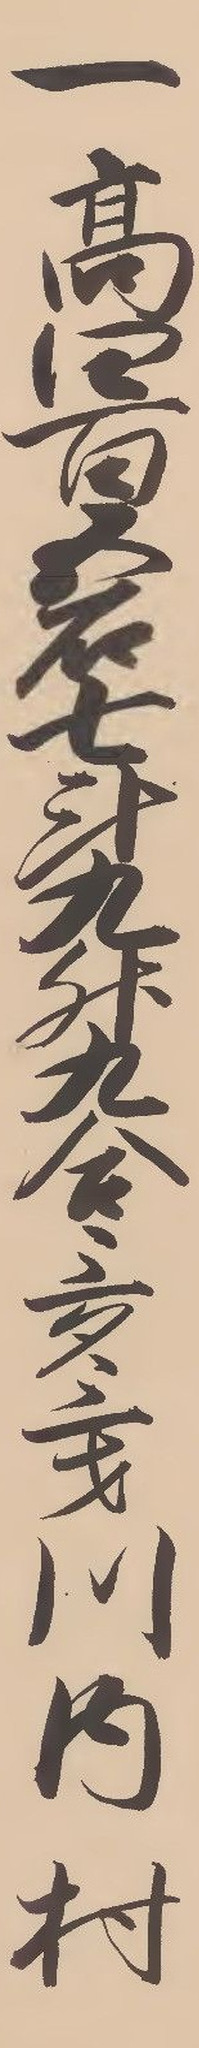一高四百五石七斗九升九合三勺三才川内村
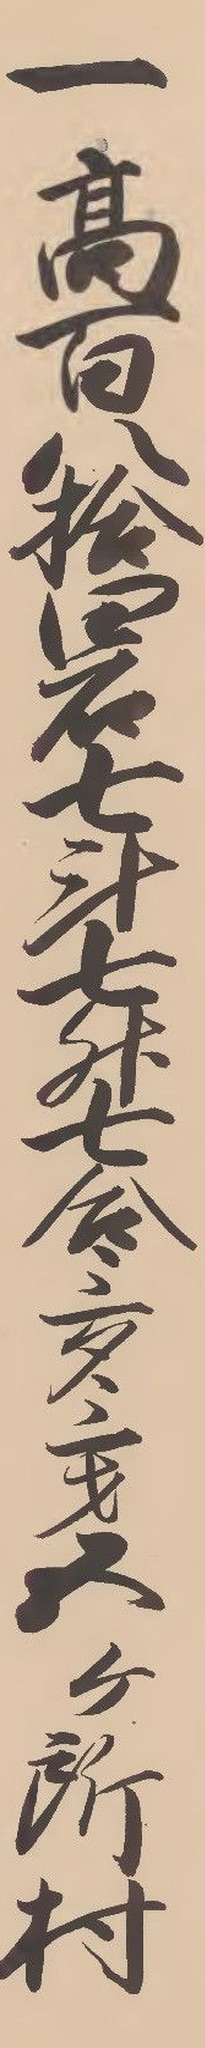一高百八拾四石七斗七升七合三勺三才五ヶ所村
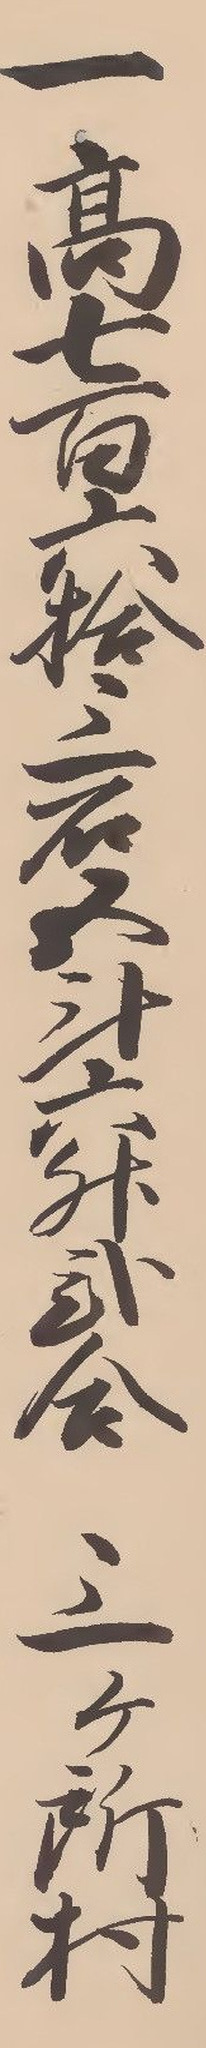一高七百六拾三石五斗六升弐合三ヶ所村
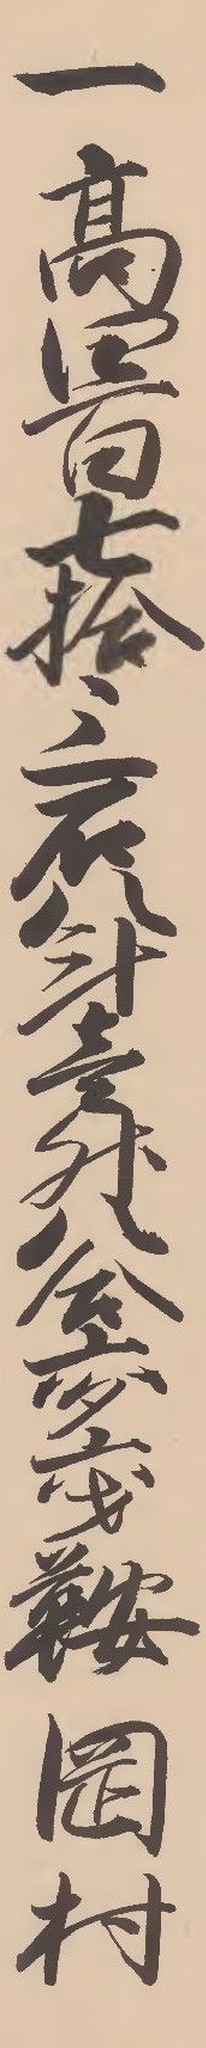一高四百七拾三石八斗壱升八合六勺六才鞍岡村

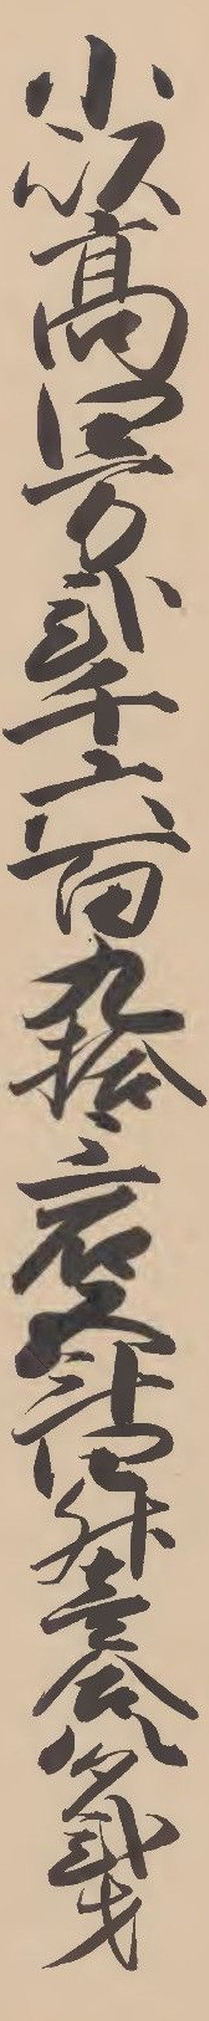小以高四万弐千六百九拾三石五斗四升壱合八勺弐才
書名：日向国郷帳
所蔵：国立公文書館 National Archives of Japan
